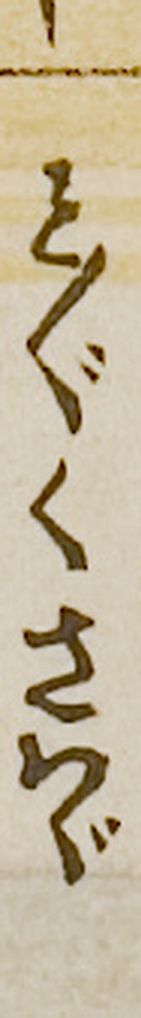こと〴〵くさはぐ
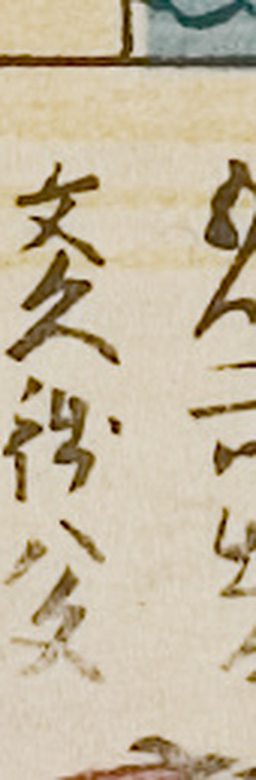文久銭八文
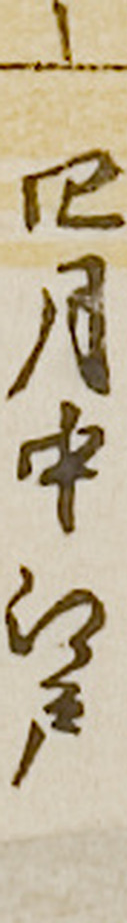四月中江戸
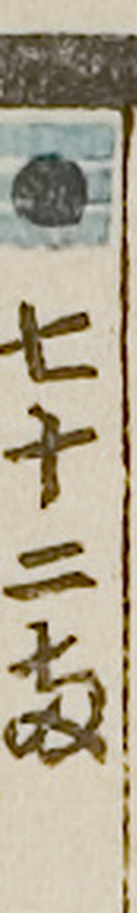●七十二両
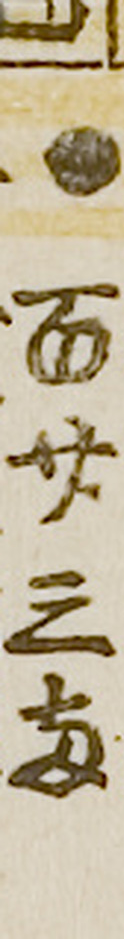●百廿三両
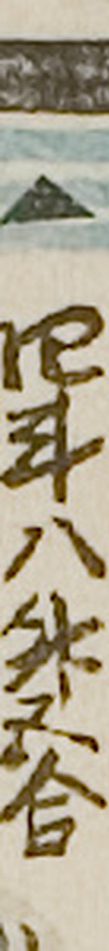▲四斗八升五合
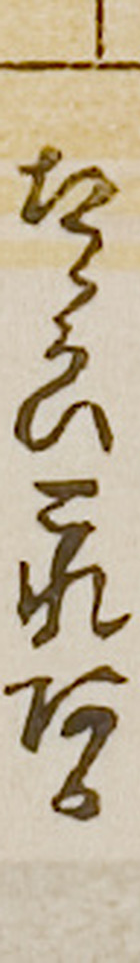たゝかいこれある
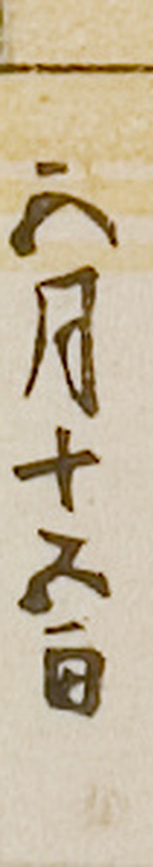五月十五日
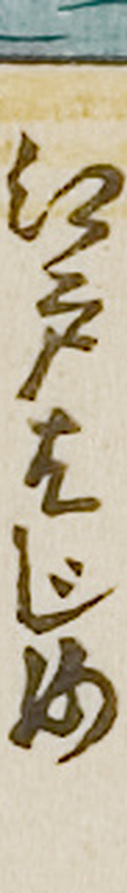江戸はじめ
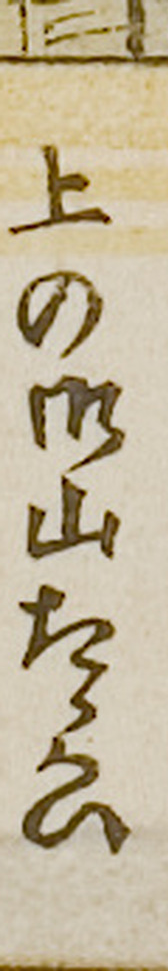上の御山たゝかい
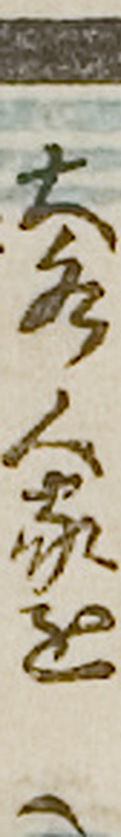大水人家を
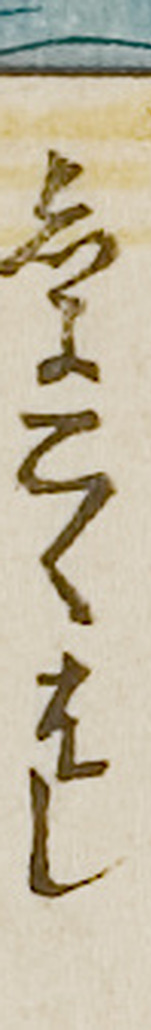しよこくはし
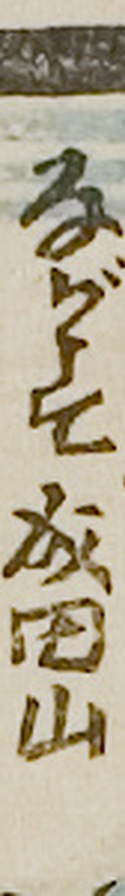ながす成田山
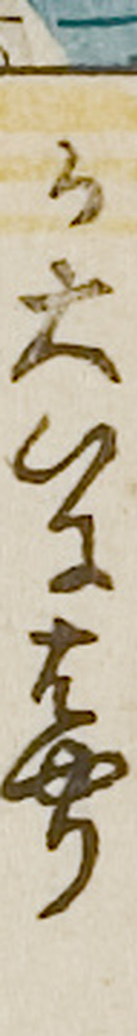か大いにはやり
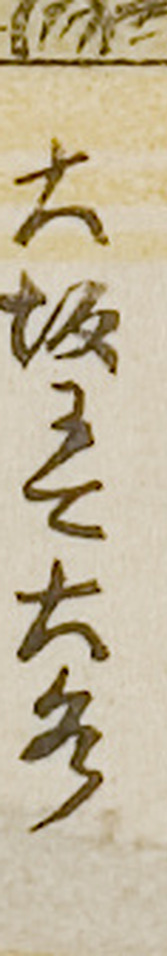大坂にて大水
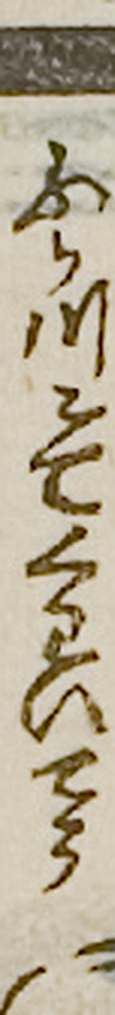ふか川にてくわいてう
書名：嘉永年間より米相場直段并年代記書抜大新版
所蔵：東京大学総合図書館 General Library in the University of Tokyo, JAPAN
